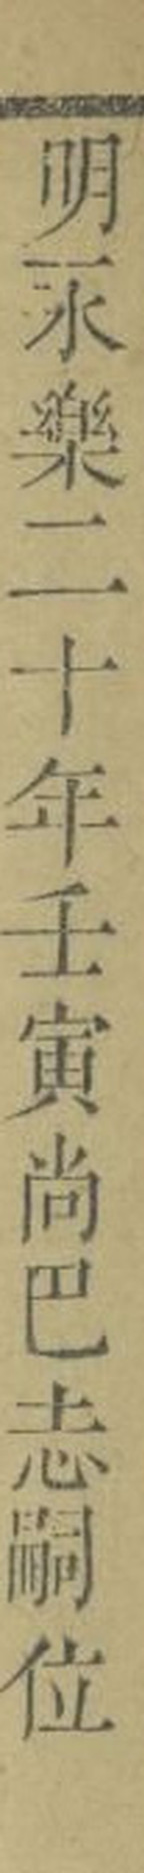明永楽二十年壬寅尚巴志嗣位
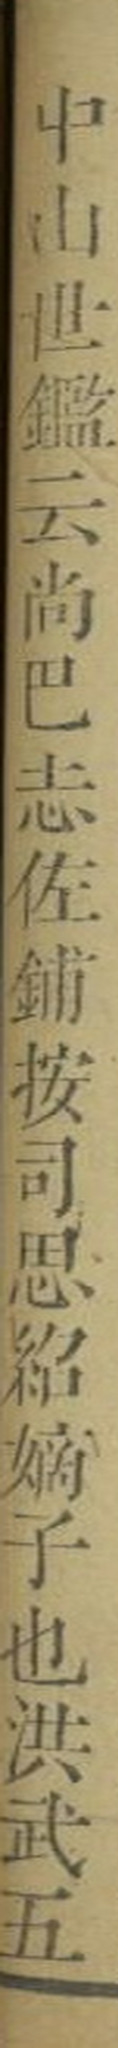中山世鑑云尚巴志佐鋪按司思紹嫡子也洪武五
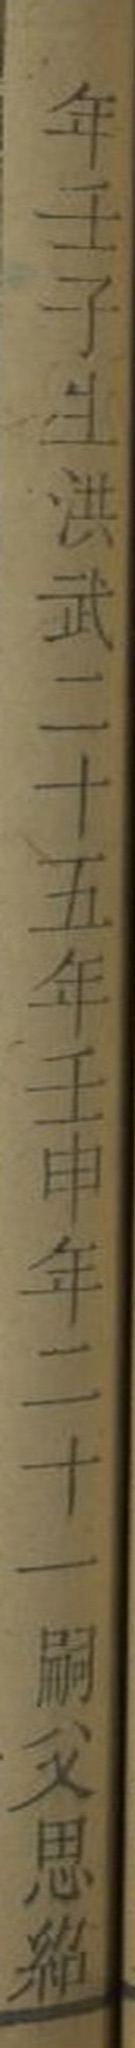年壬子生洪武二十五年壬申年二十一嗣父思紹
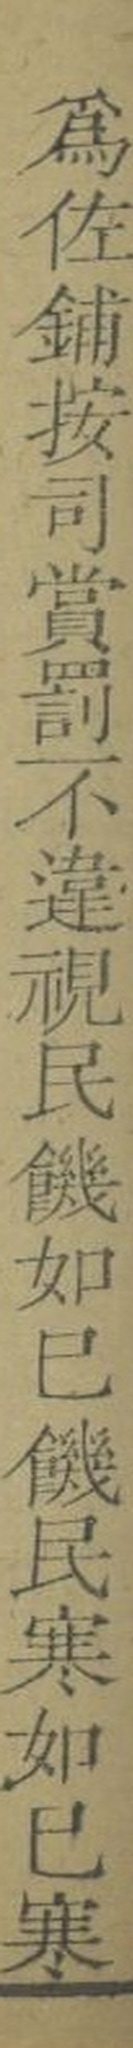為佐鋪按司賞罰不違視民饑如巳饑民寒如巳寒
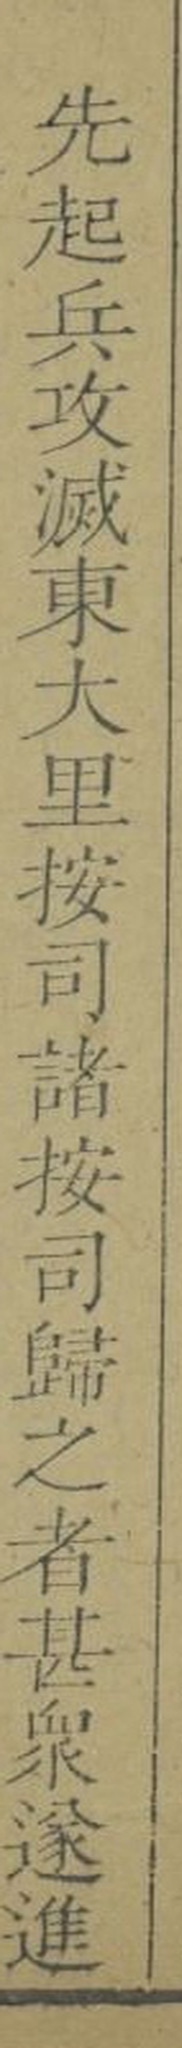先起兵攻滅東大里按司諸按司帰之者甚衆遂進
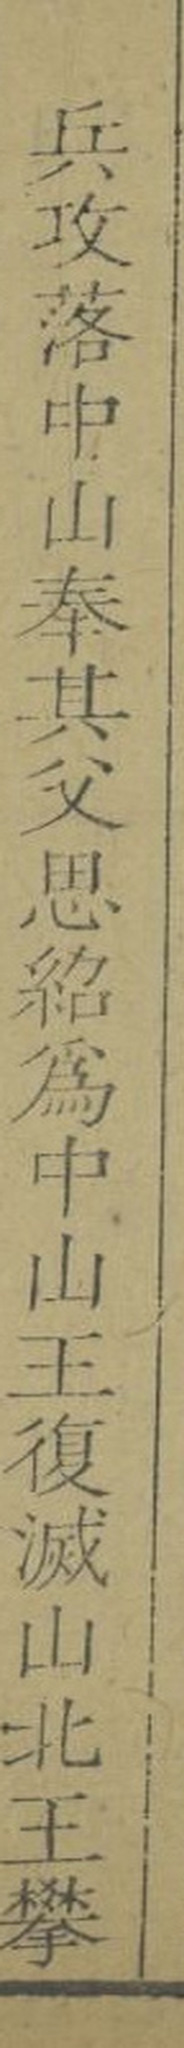兵攻落中山奉其父思紹為中山王復滅山北王攀
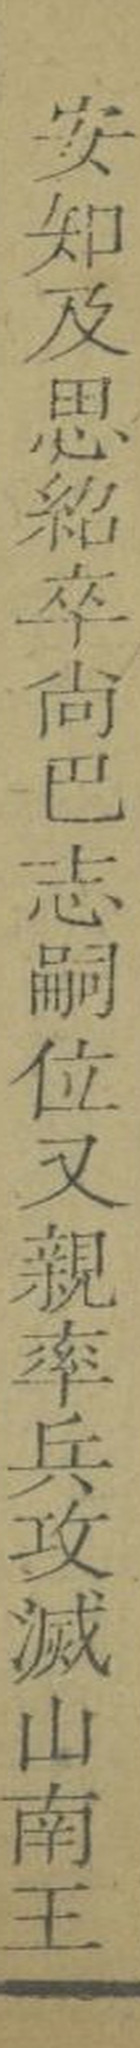安知及思紹卒尚巴志嗣位又親率兵攻滅山南王
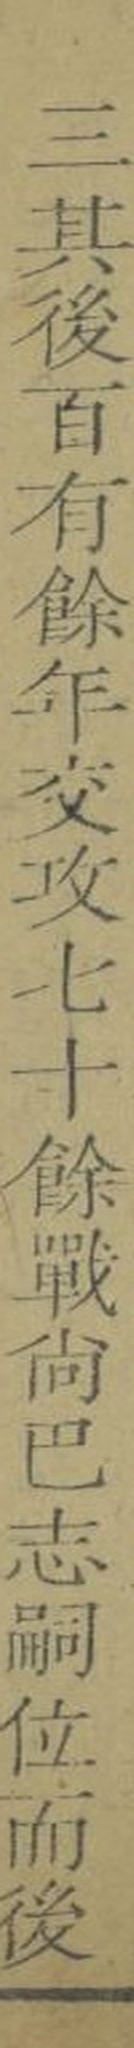三其後百有余年交攻七十余戦尚巴志嗣位而後
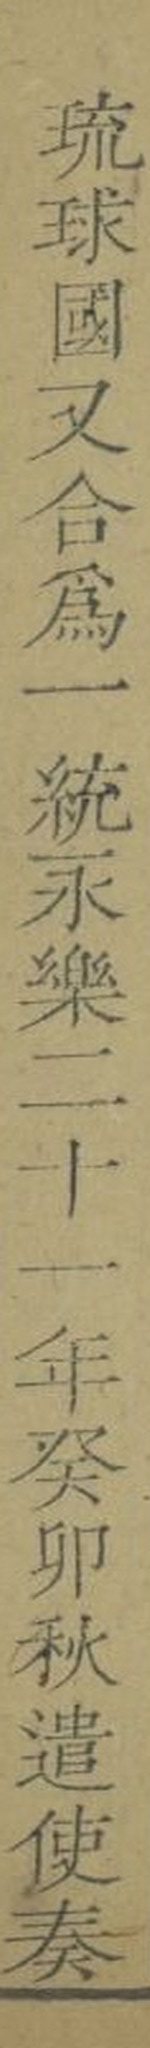琉球国又合為一統永楽二十一年癸卯秋遣使奏
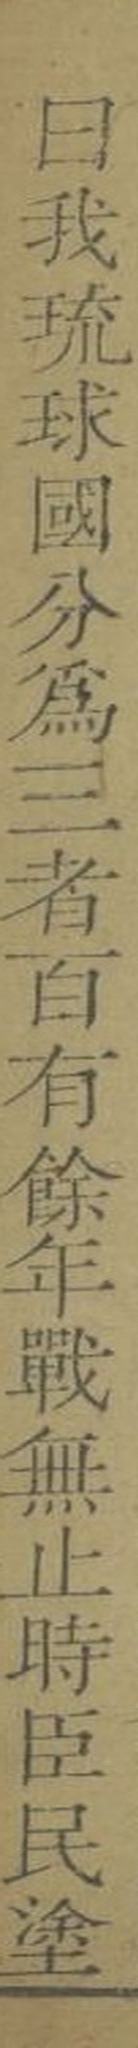曰我琉球国分為三者百有余年戦無止時臣民塗

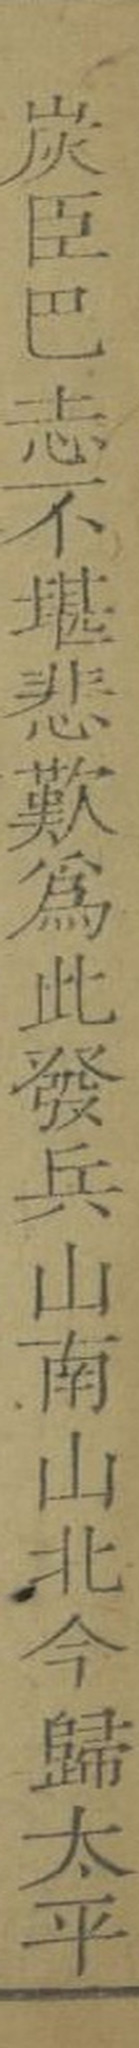炭臣巴志不堪悲歎為此発兵山南山北今帰太平
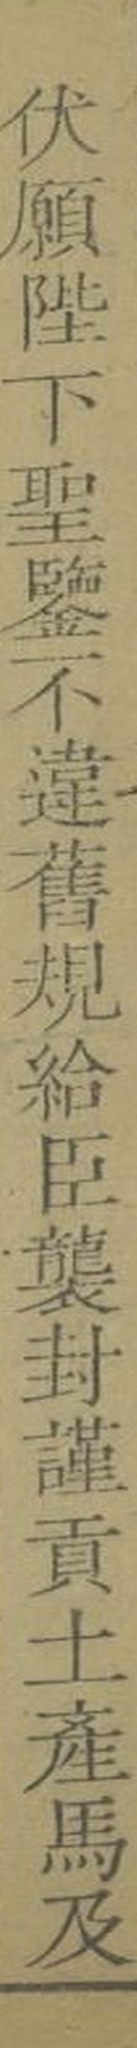伏願陛下聖鑑不違旧規給臣襲封謹貢土産馬及
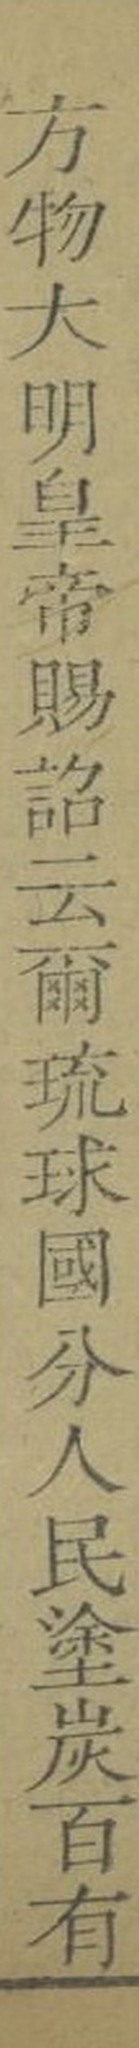方物大明皇帝賜詔云爾琉球国分人民塗炭百有
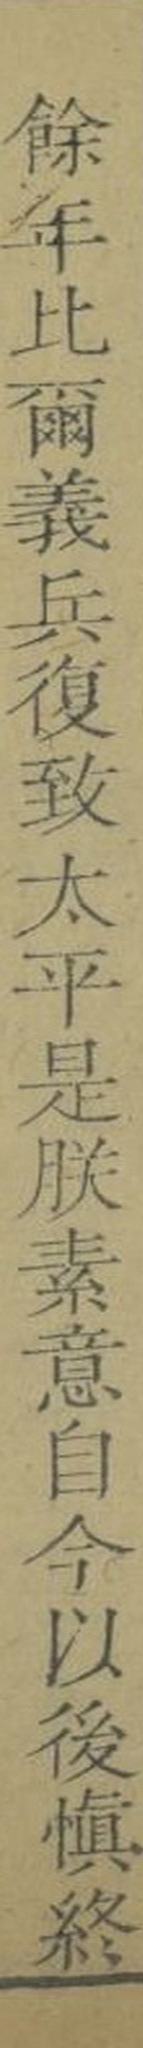余年比爾義兵復致太平是朕素意自今以後慎終
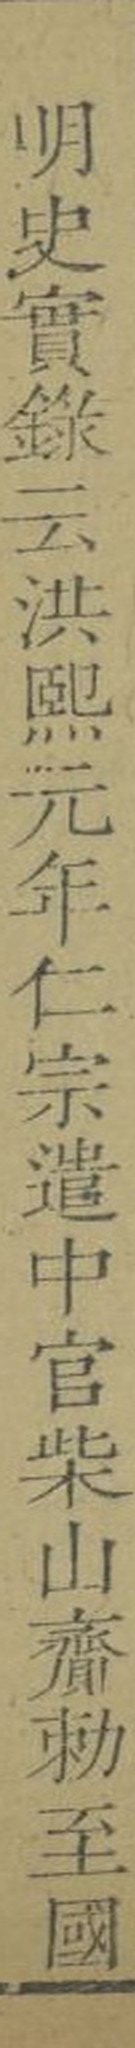明史実録云洪熙元年仁宗遣中官柴山齎勅至国
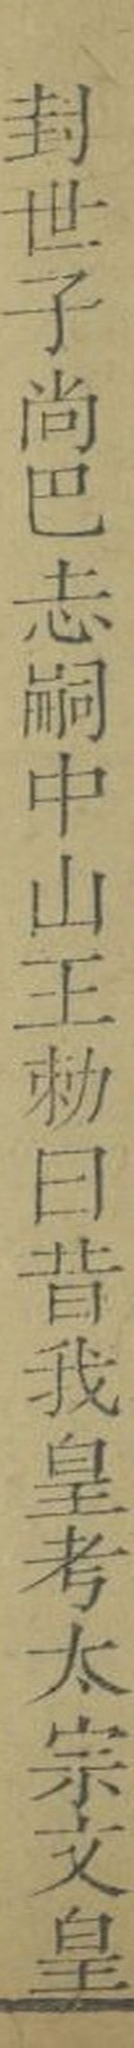封世子尚巴志嗣中山王勅曰昔我皇考太宗文皇
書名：中山伝信録 巻三
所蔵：University of the Ryukyus Library
